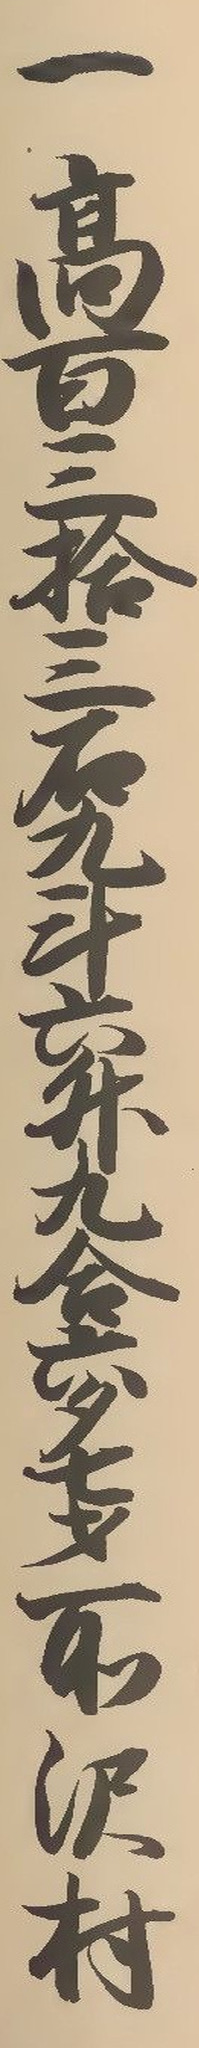一高百三拾三石九斗六升九合六勺七才所沢村
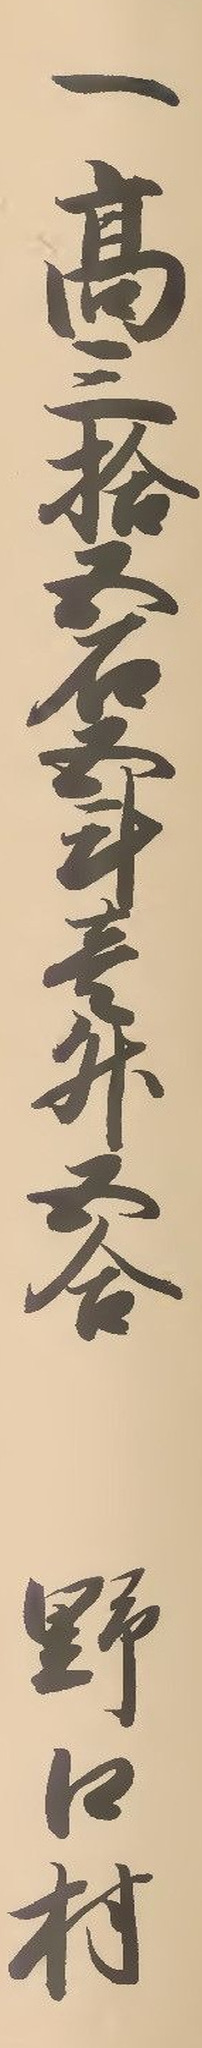一高三拾五石五斗壱升五合野口村
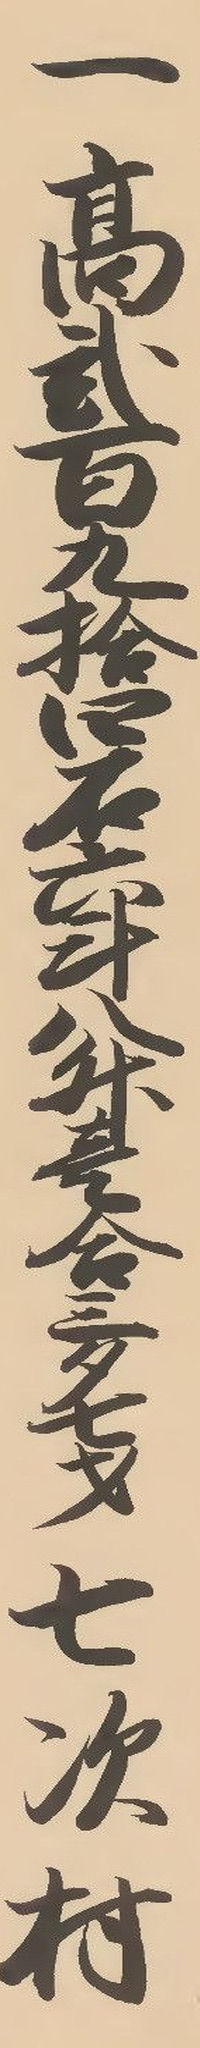一高弐百九拾四石六斗八升壱合三勺七才七次村
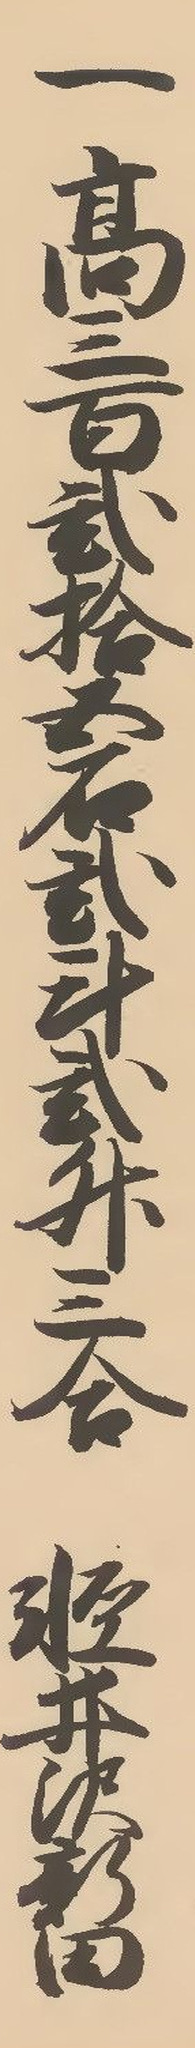一高三百弐拾五石弐斗弐升三合軽井沢新田
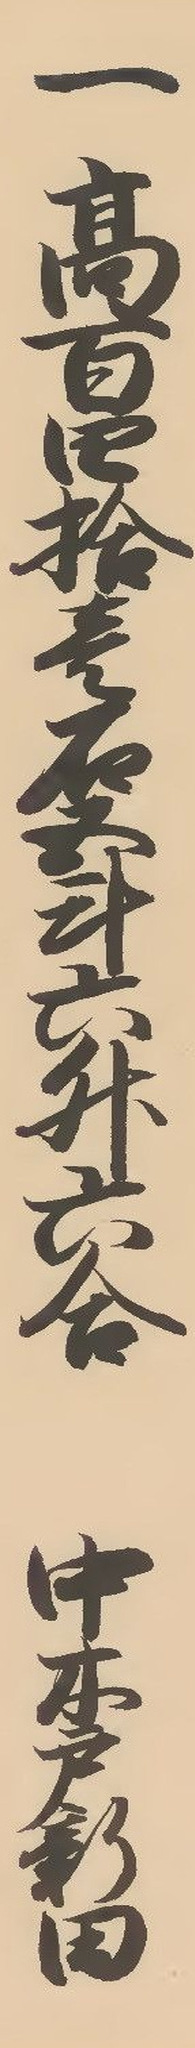一高百四拾壱石五斗六升六合中木戸新田

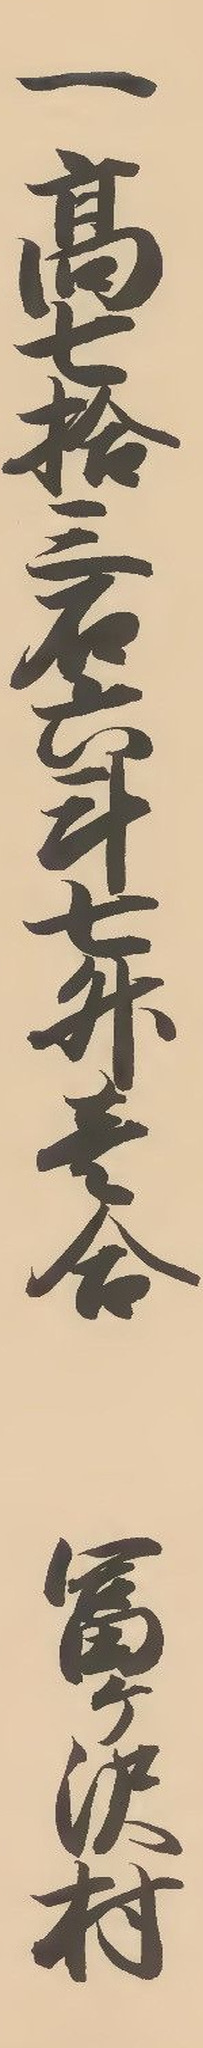一高七拾三石六斗七升壱合富ヶ沢村
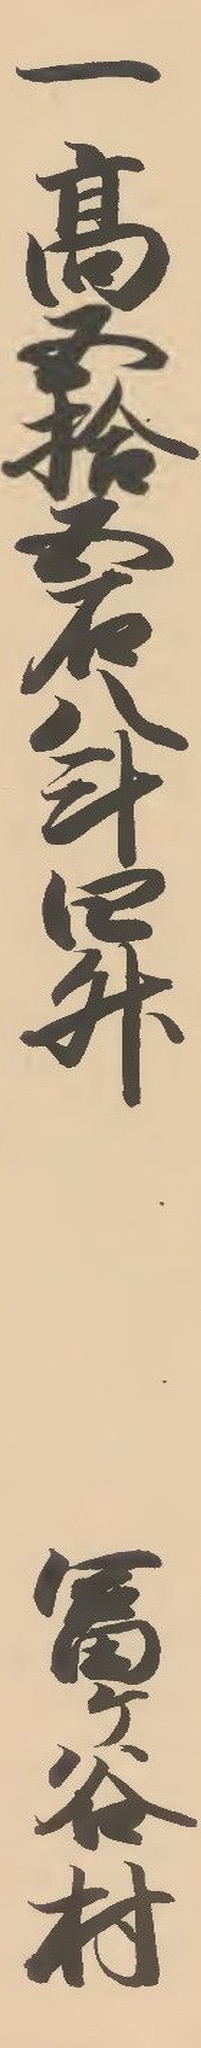一高五拾五石八斗四升富ヶ谷村
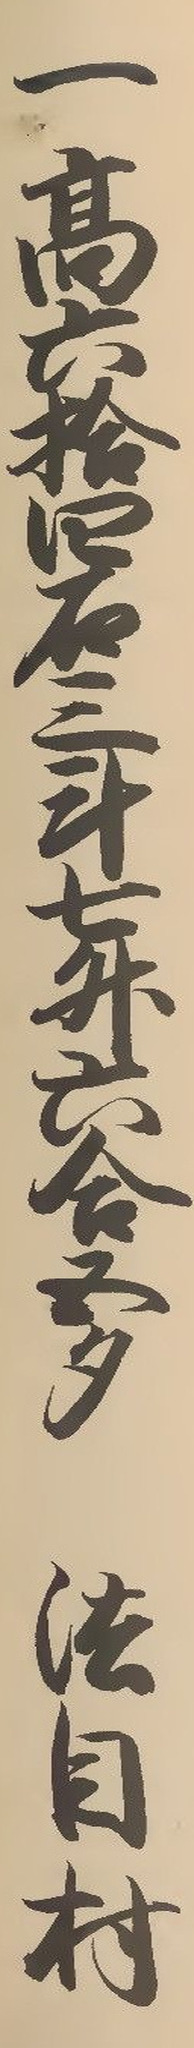一高六拾四石三斗七升六合五勺法目村
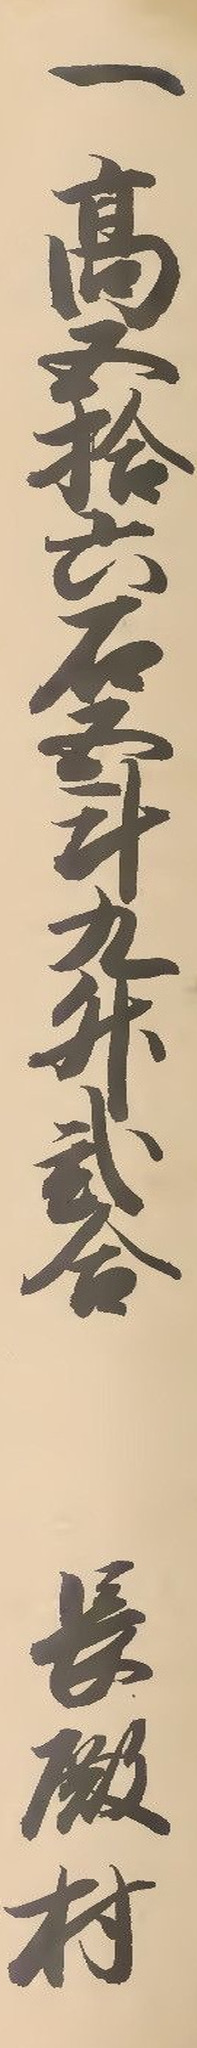一高五拾六石五斗九升弐合長殿村
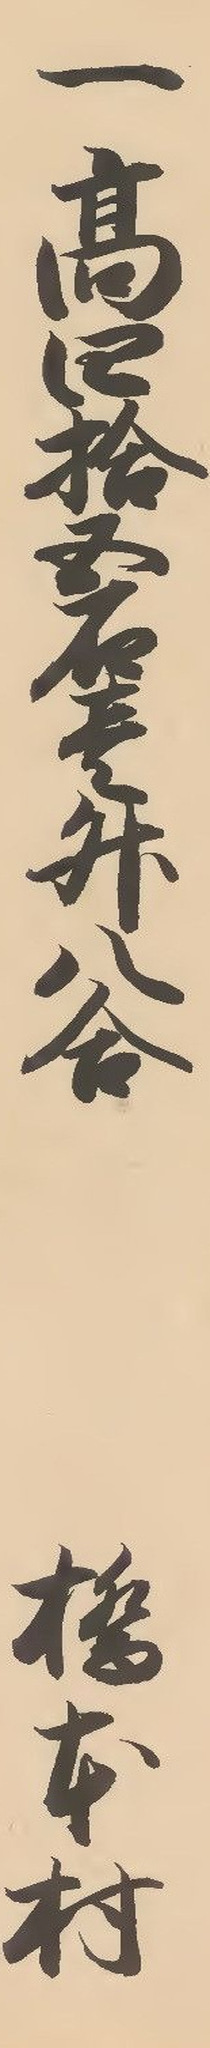一高四拾五石壱升八合橋本村
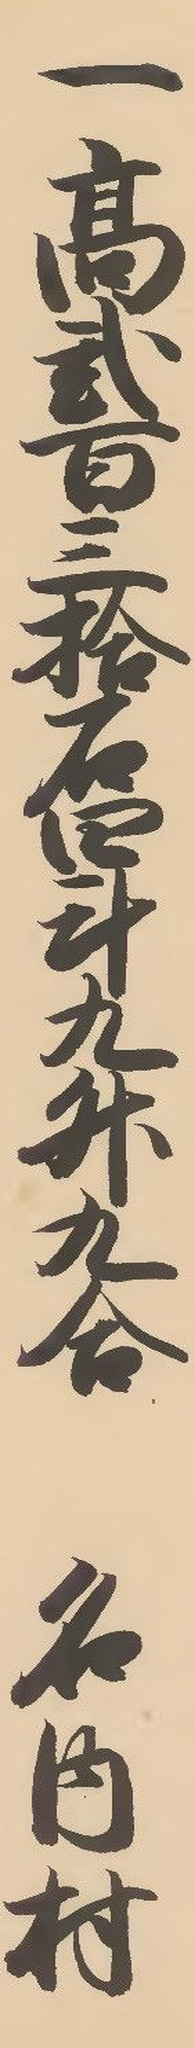一高弐百三拾石四斗九升九合名内村
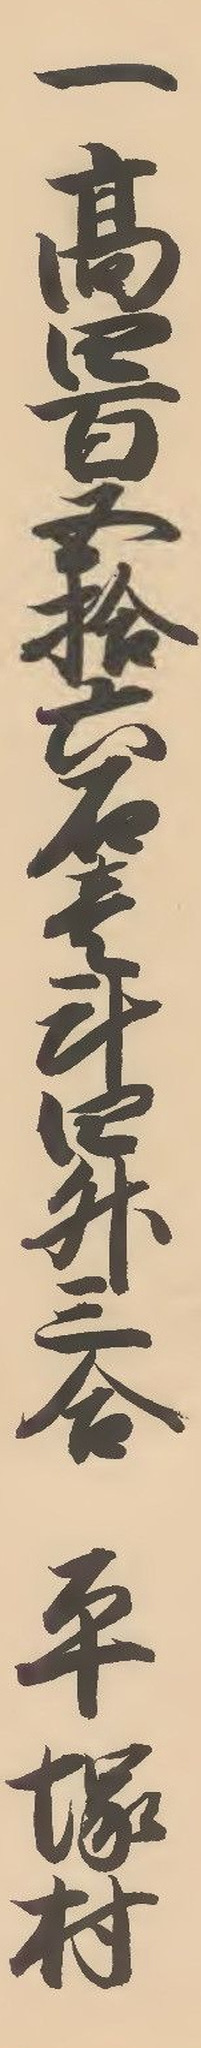一高四百五拾六石壱斗四升三合平塚村

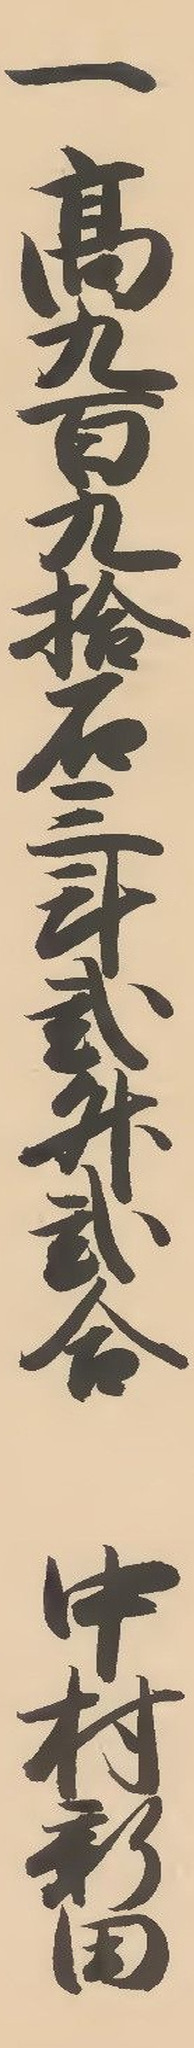一高九百九拾石三斗弐升弐合中村新田
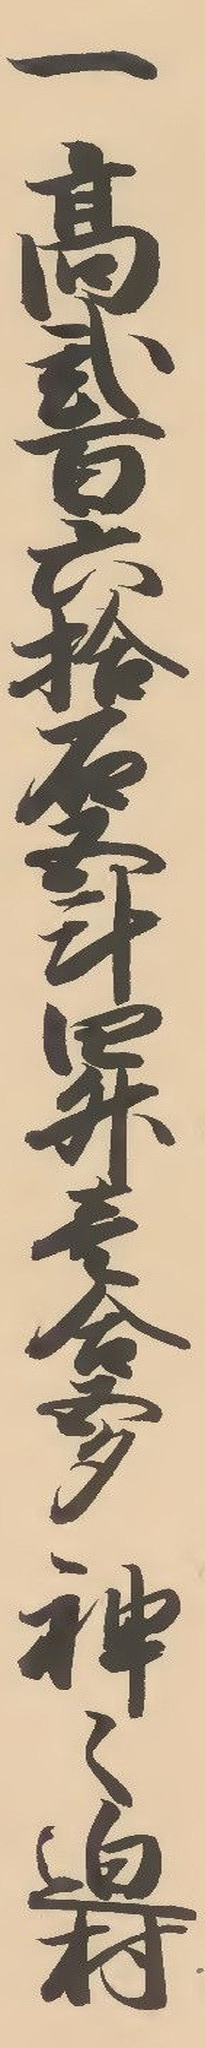一高弐百六拾石五斗四升壱合五勺神々迫村
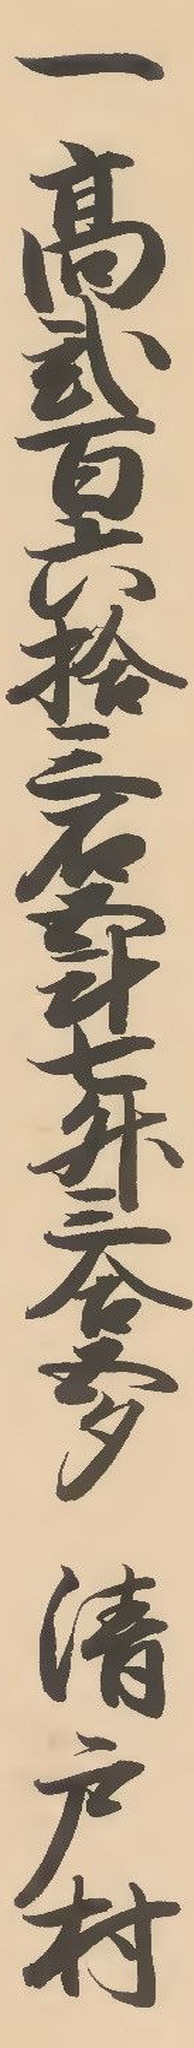一高弐百六拾三石五斗七升三合五勺清戸村
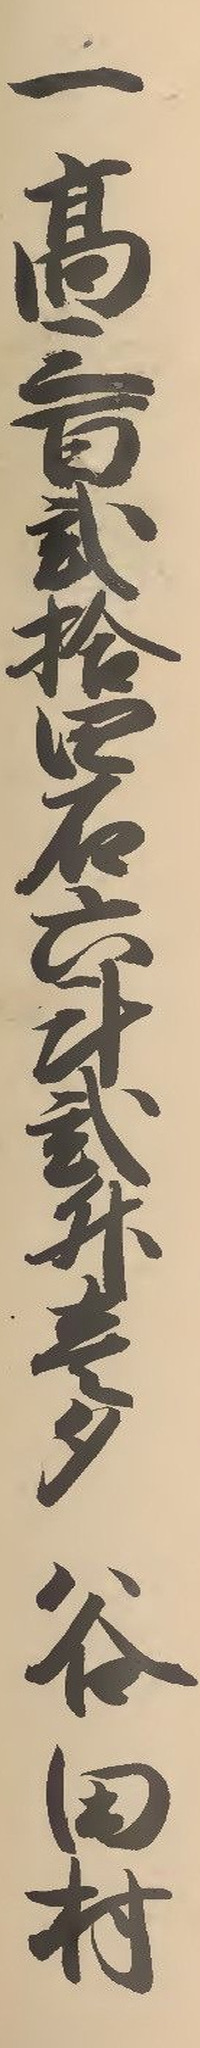一高三百弐拾四石六斗弐升壱勺谷田村
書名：下総国郷帳
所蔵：国立公文書館 National Archives of Japan
